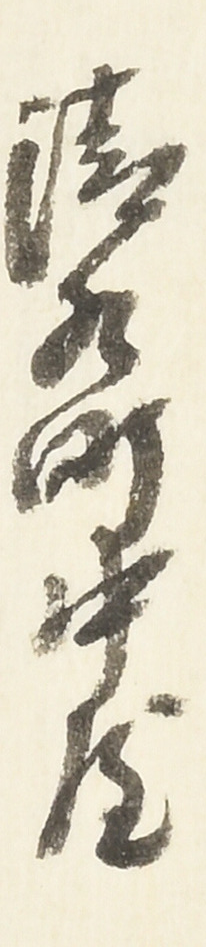清水町丁代
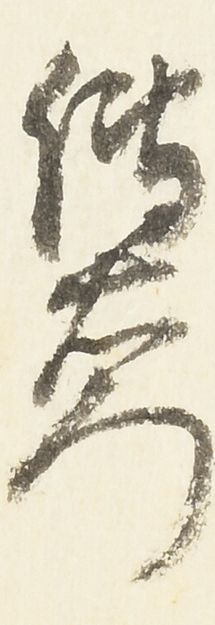伝右衛門
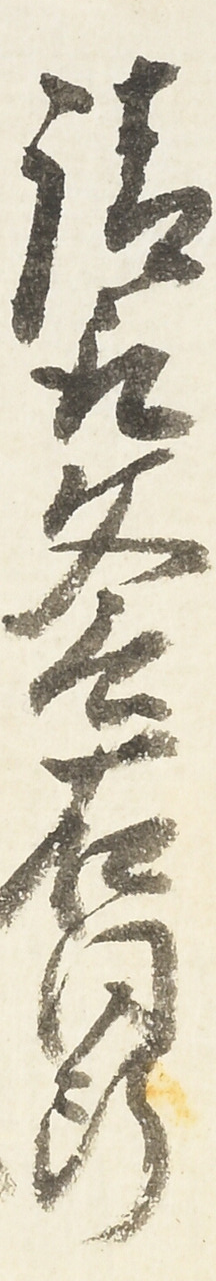請取文言右同断
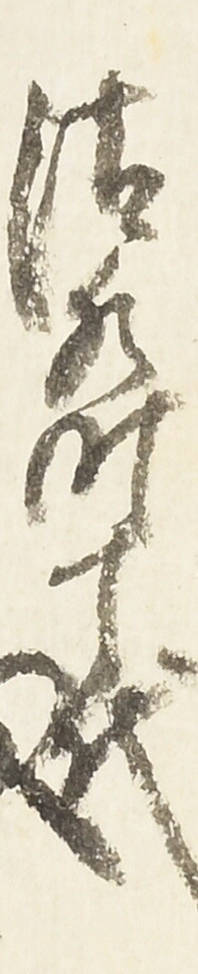清水町丁代
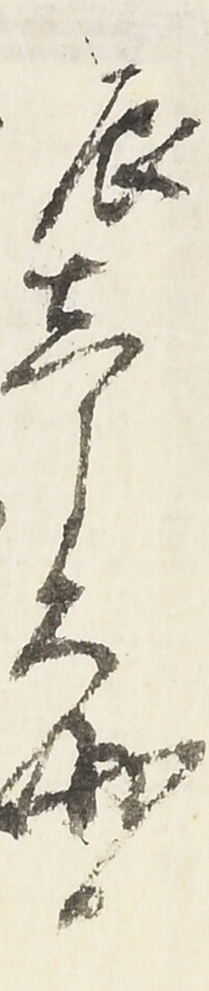辰十二月大晦日
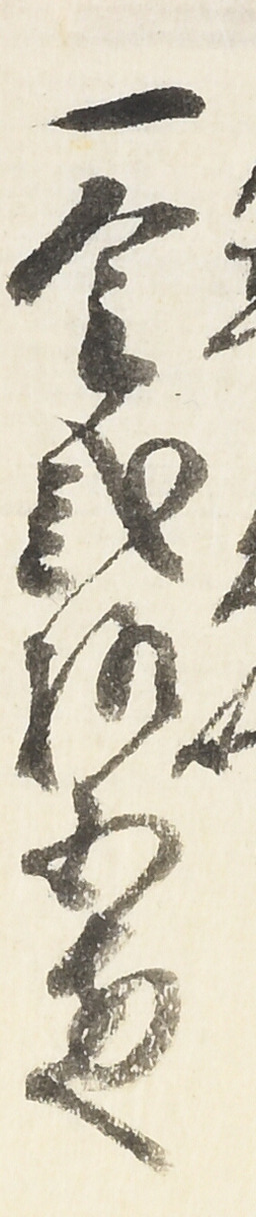一金弐拾五両
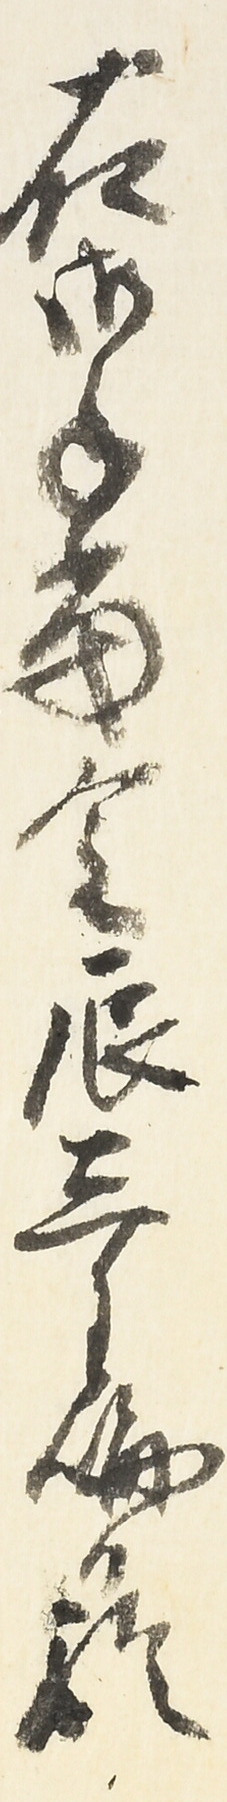右御手当金辰十二月晦日於
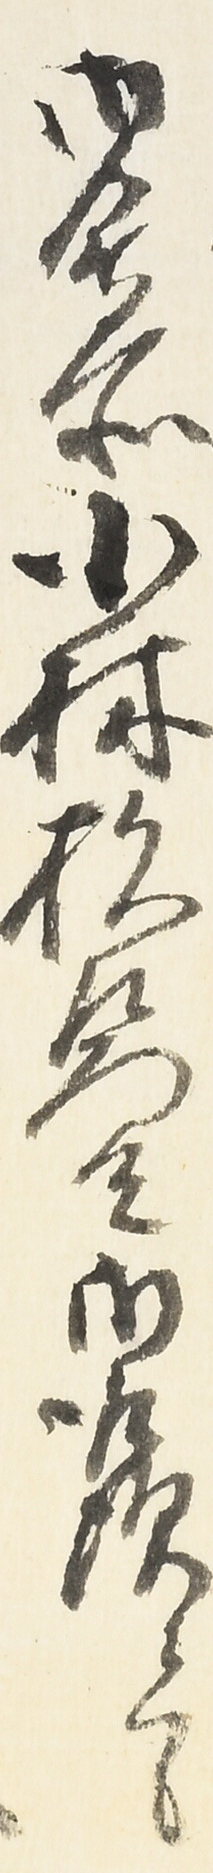御会所小林杉左衛門殿御取次ニて
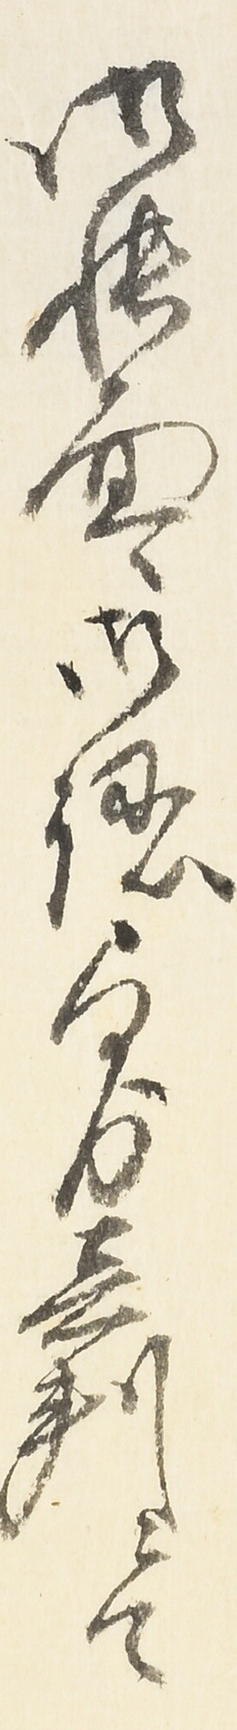御帳面へ御認与右衛門壱判ニて
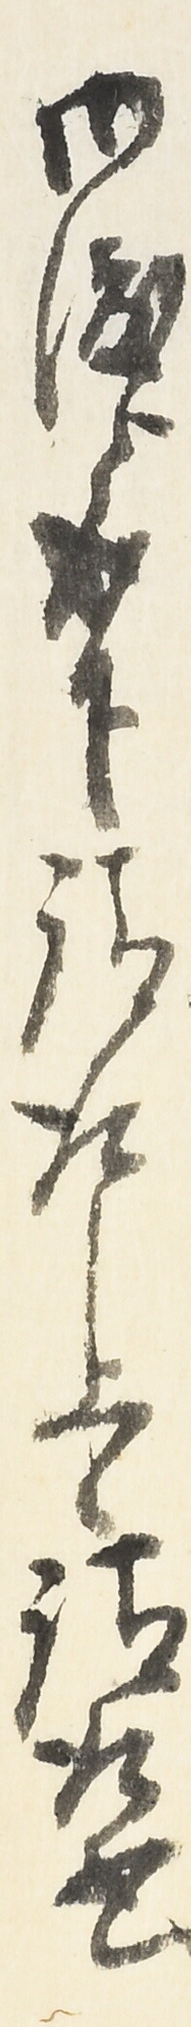御渡被成下請取申上候請取書
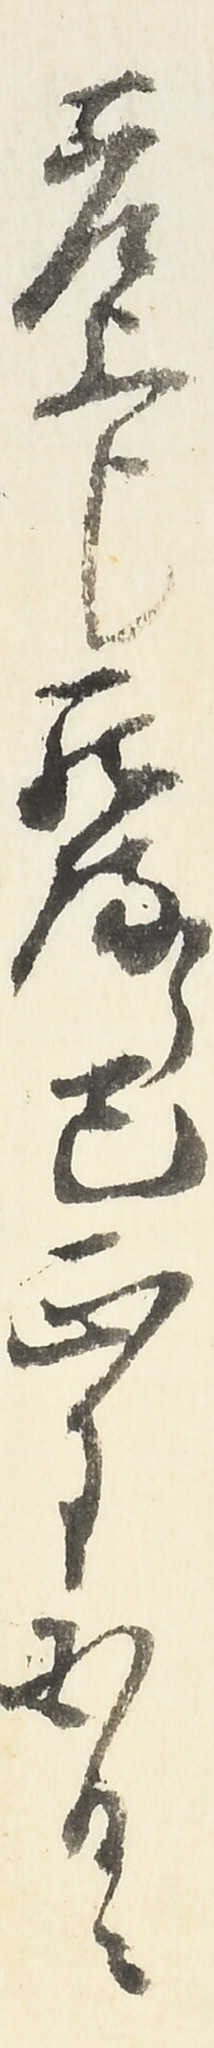差上申し罷帰り巳正月五日ニ
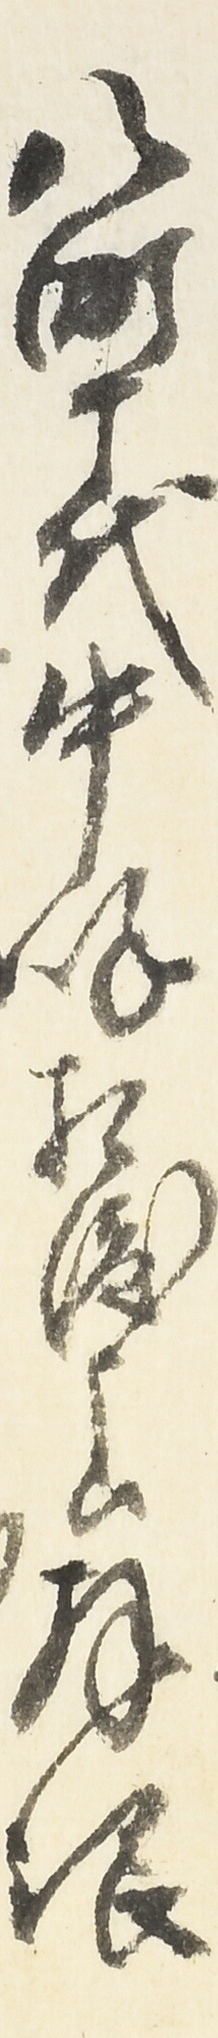八町丁代中呼相渡申候拝銀
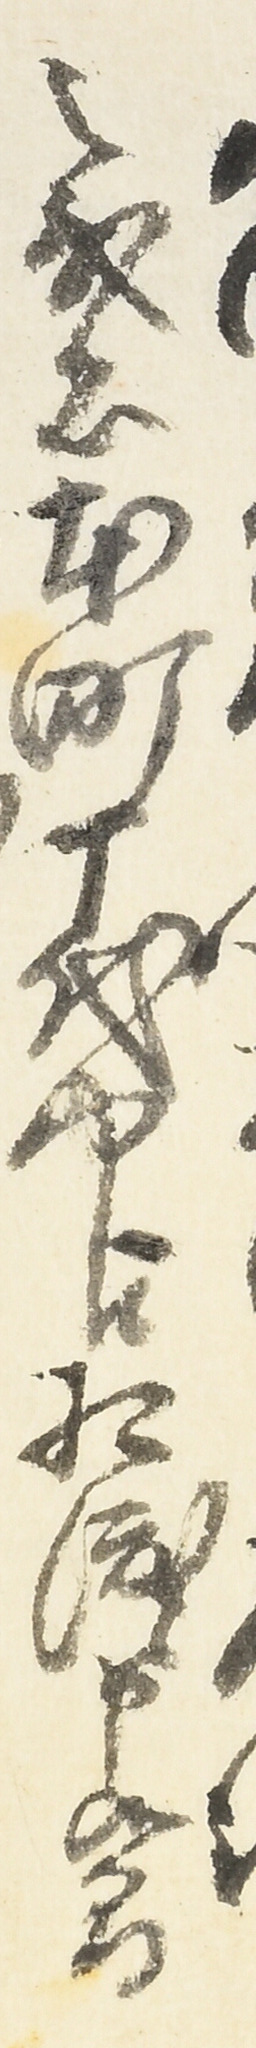之義者本町丁代中江相渡申候間
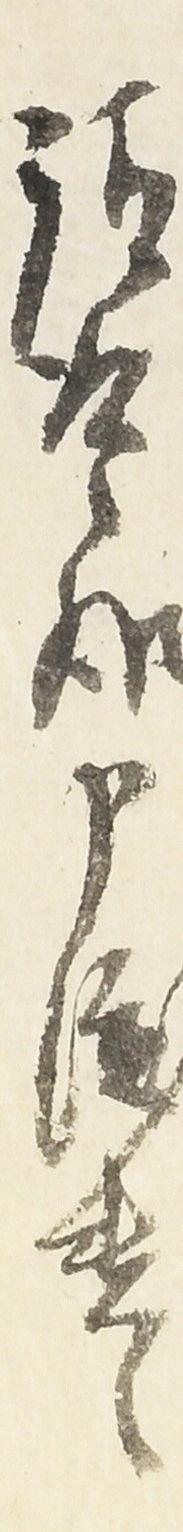請取候様申渡遣候
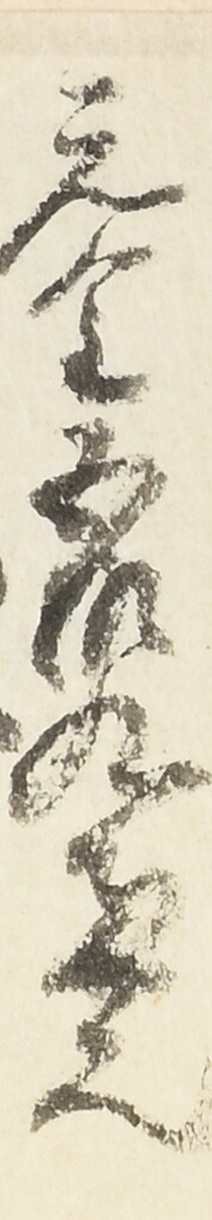元金五拾九両也
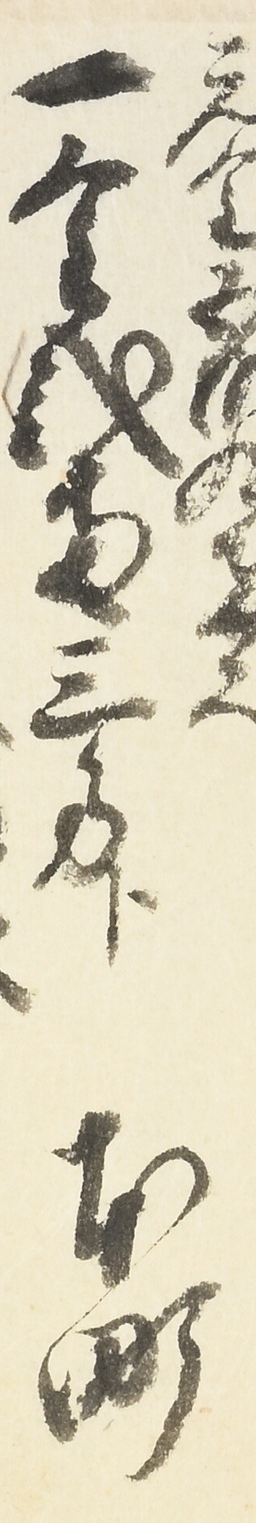一金弐両三分ト本町
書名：御才覚金御利足割渡扣帳
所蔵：伊那市立高遠町図書館・合同会社AMANE
